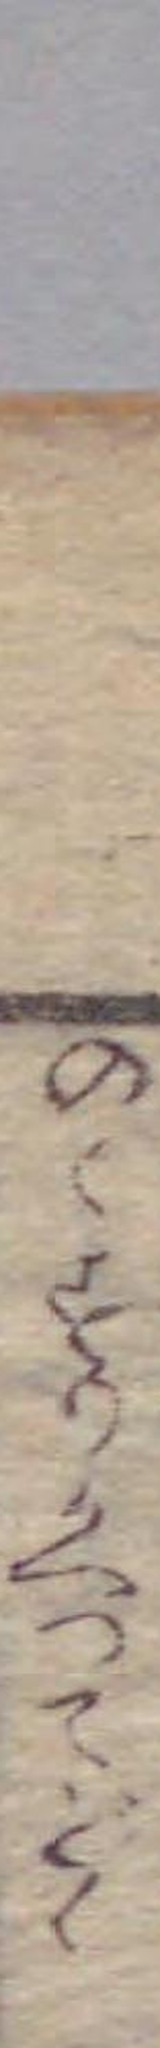のくすりかへつてどく
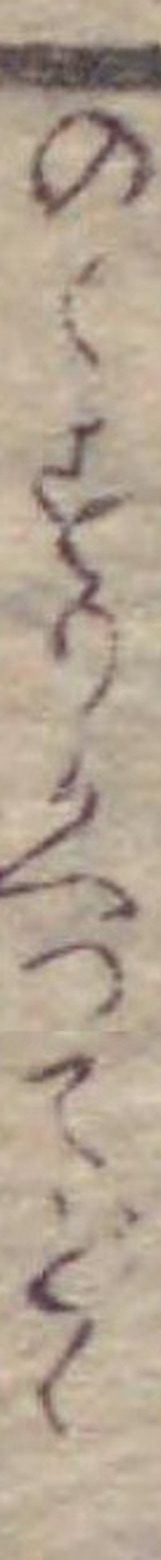のくすりかへつてどく
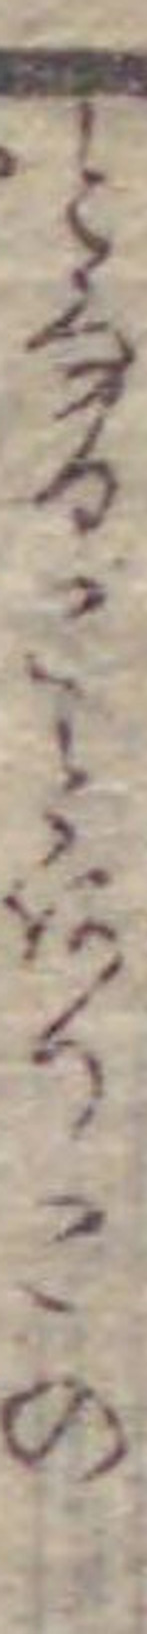となることありこの
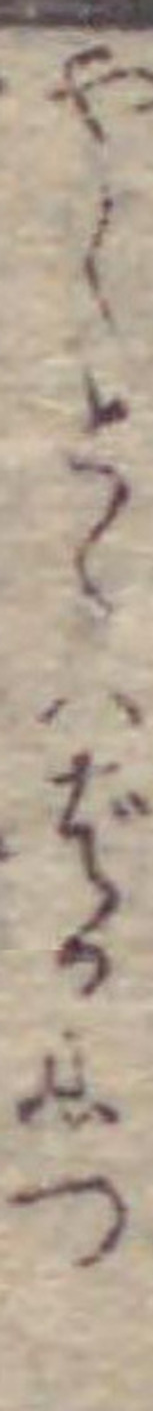やくとくはばかにつ
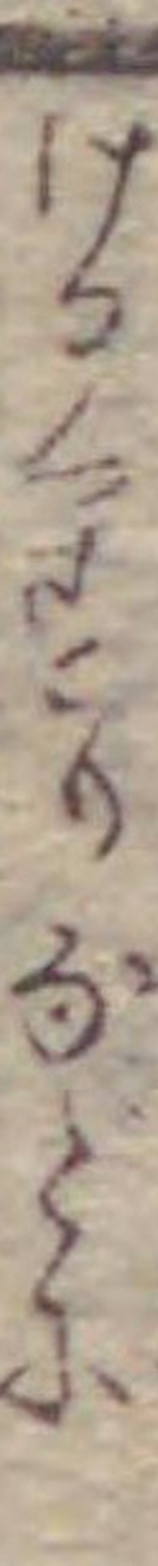けるくすりなどに
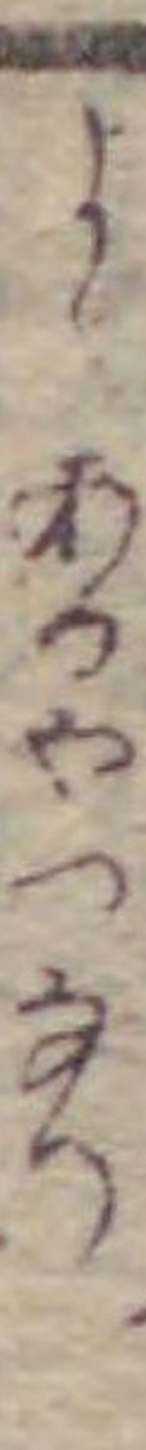よくあるやつなり
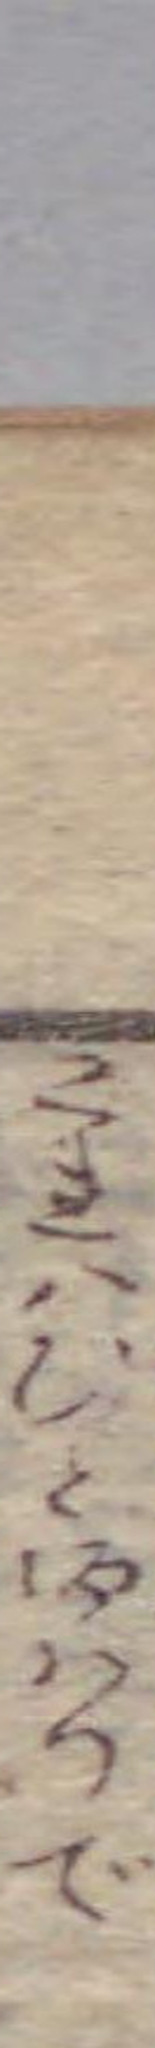これはひとまはりで
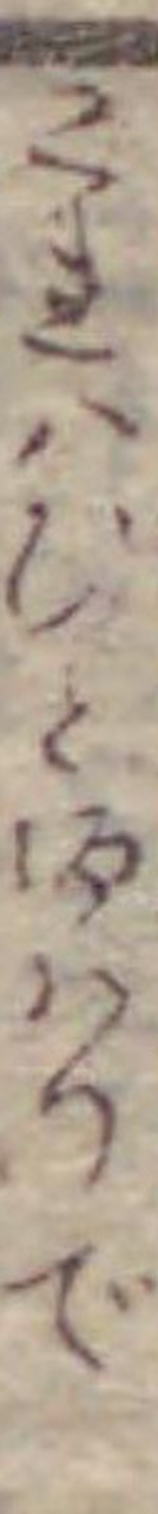これはひとまはりで
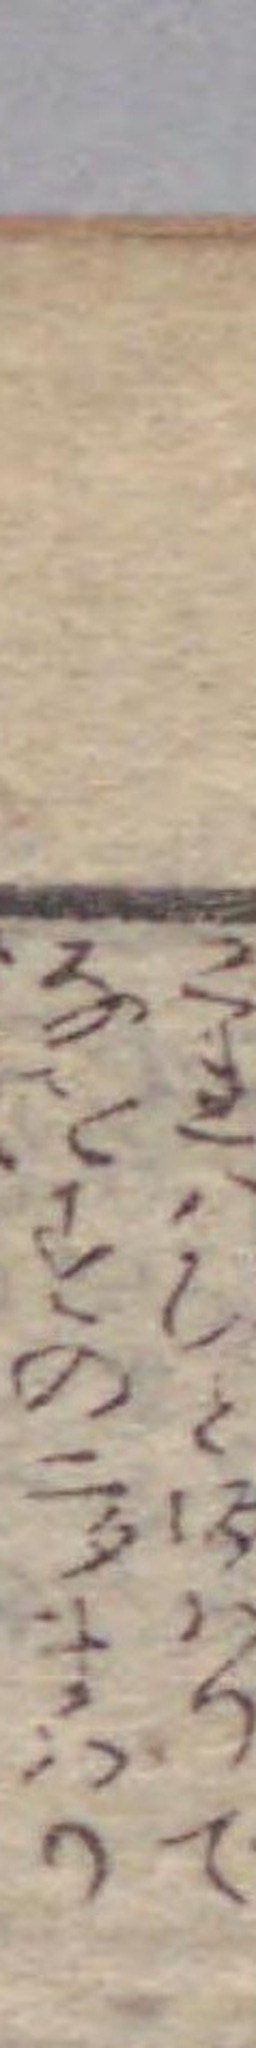なをすの二たまはり
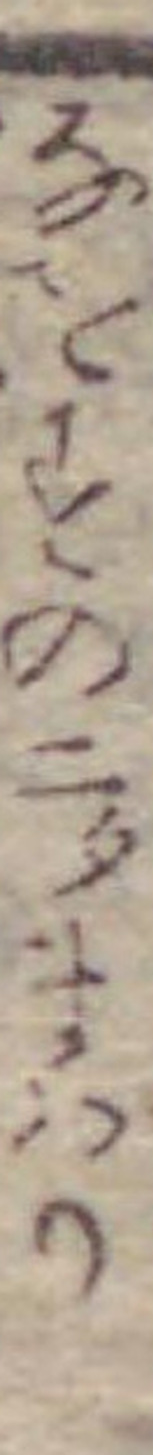なをすの二たまはり
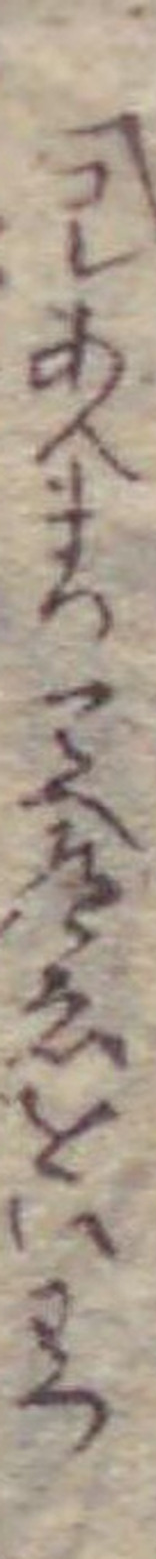〽コレあんまりてへへゑをいわつ
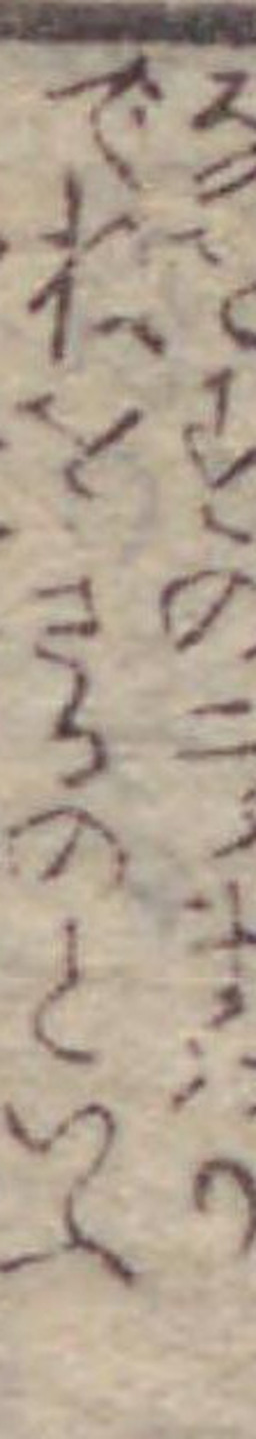でねをきるのといふ
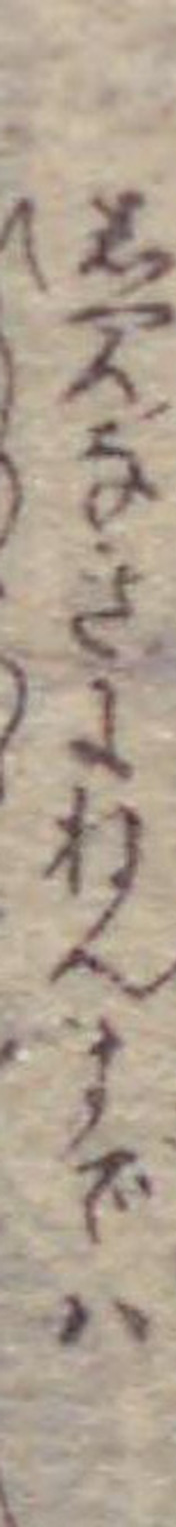しやるなきよねんまでは
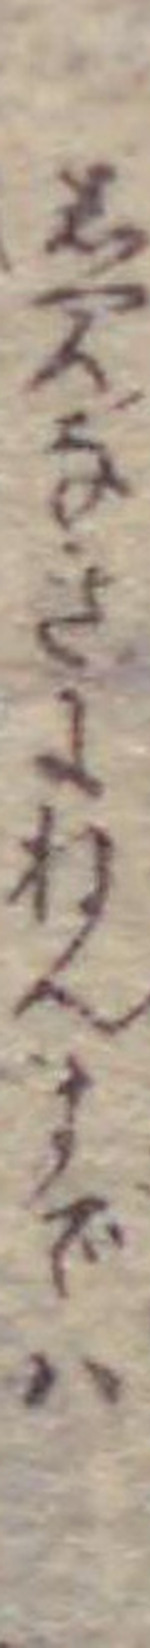しやるなきよねんまでは
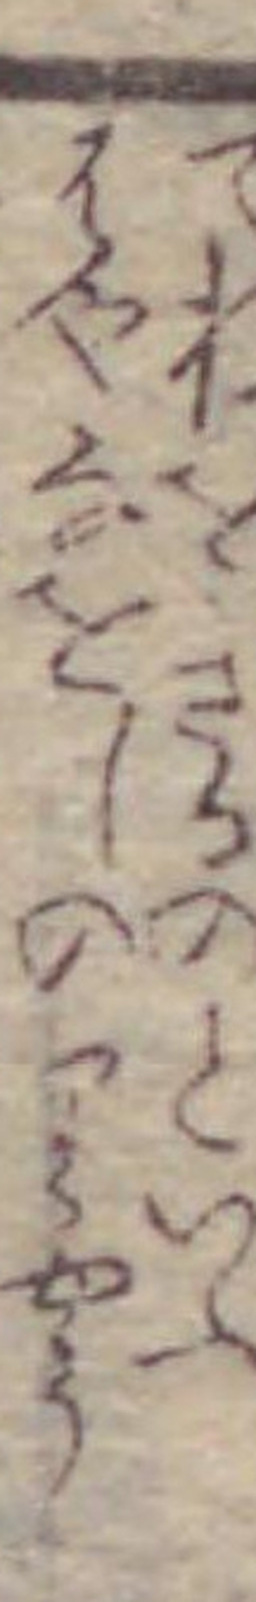はやなをしのりやう
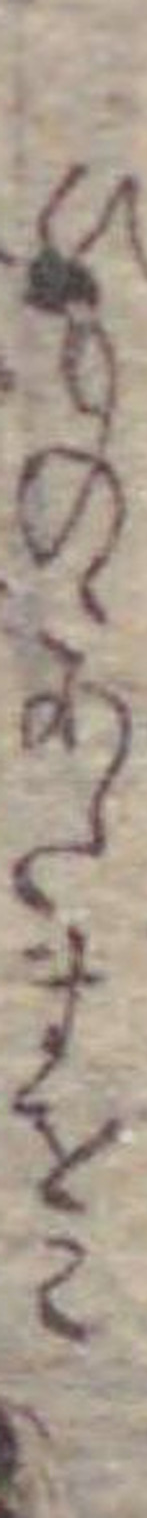ひものゝあたまをこ
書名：鼻下長生薬 : 3巻
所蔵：国立国会図書館 National Diet Library, JAPAN
